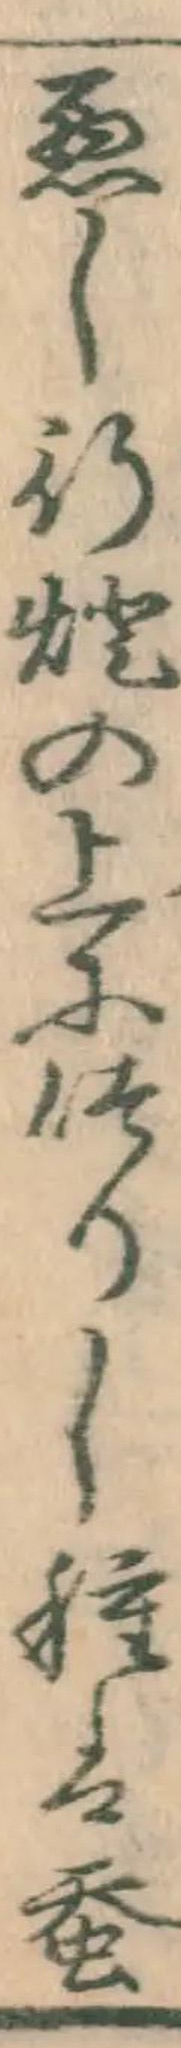悪し行燈の上につりし種は蚕
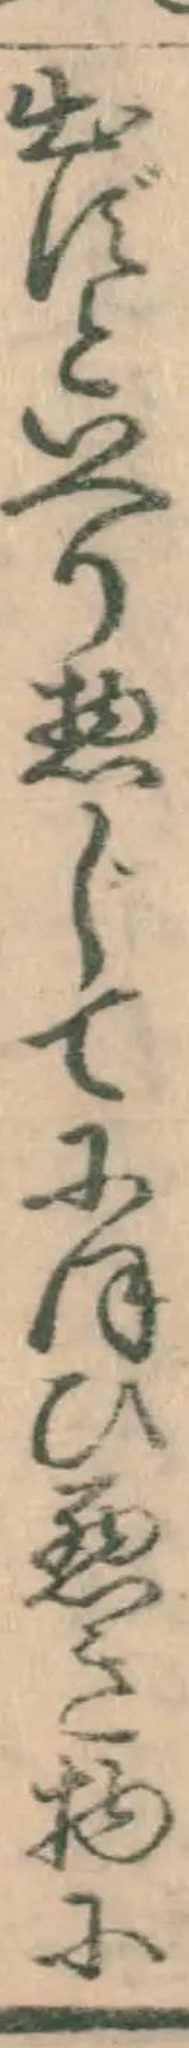出ずといへり惣じてにほひ悪き物に
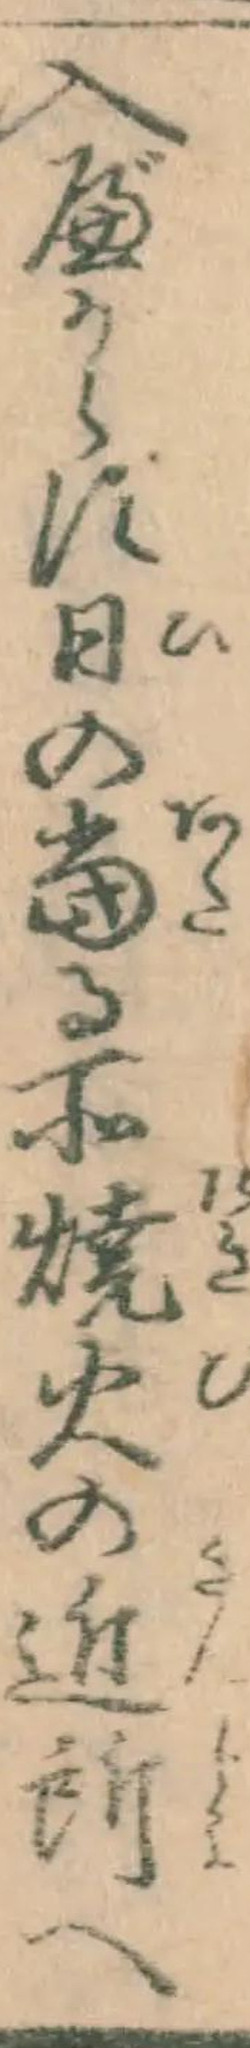人べからず日の当る所焼火の近所へ
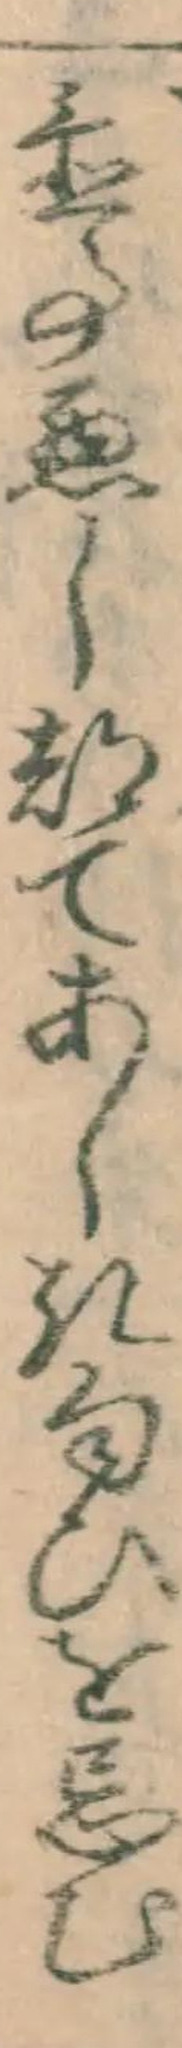置事悪し都てあしき匂ひを忌む
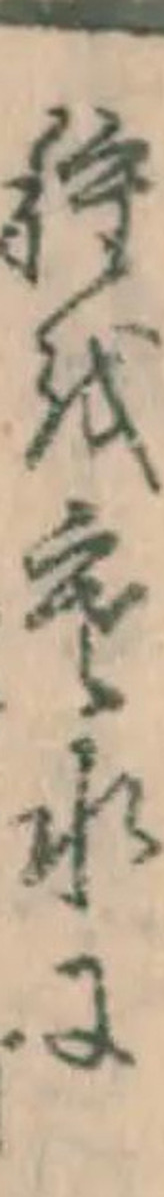種を寒水に
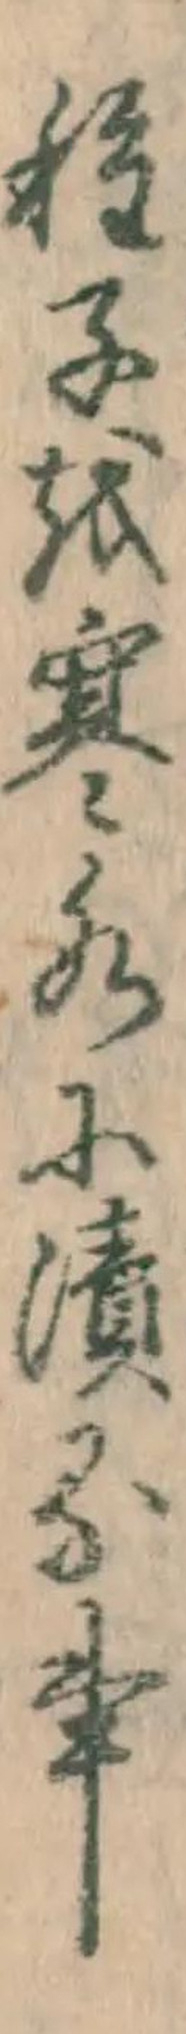種子を寒水に漬る事
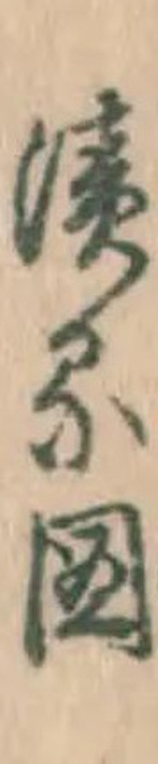漬る図
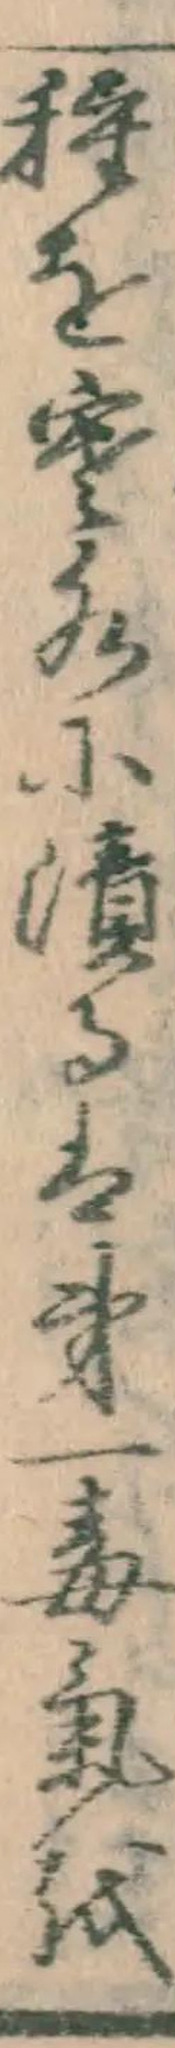種を寒水に漬るは第一毒気を
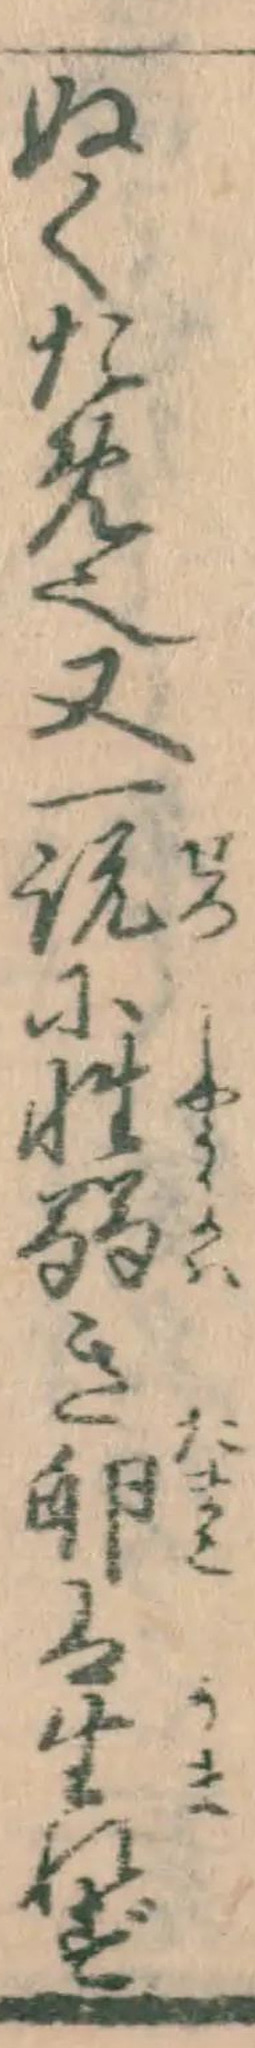ぬくため也又一説に性弱き卵は生れず
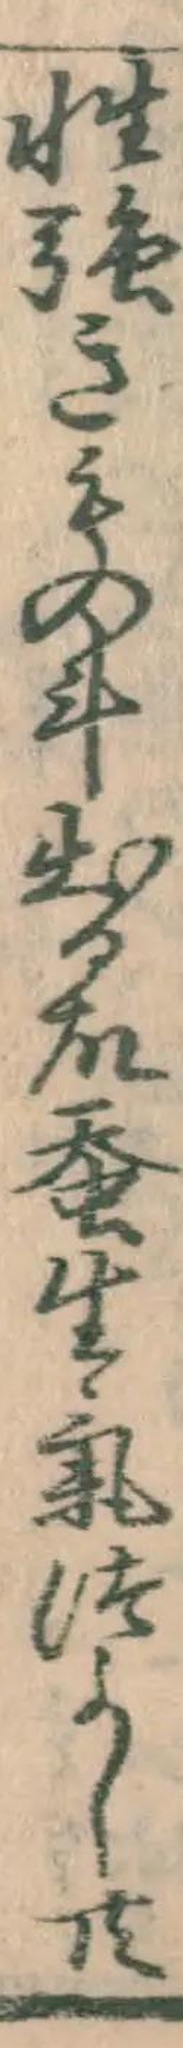性強きもの斗出る故蚕生気つよし共
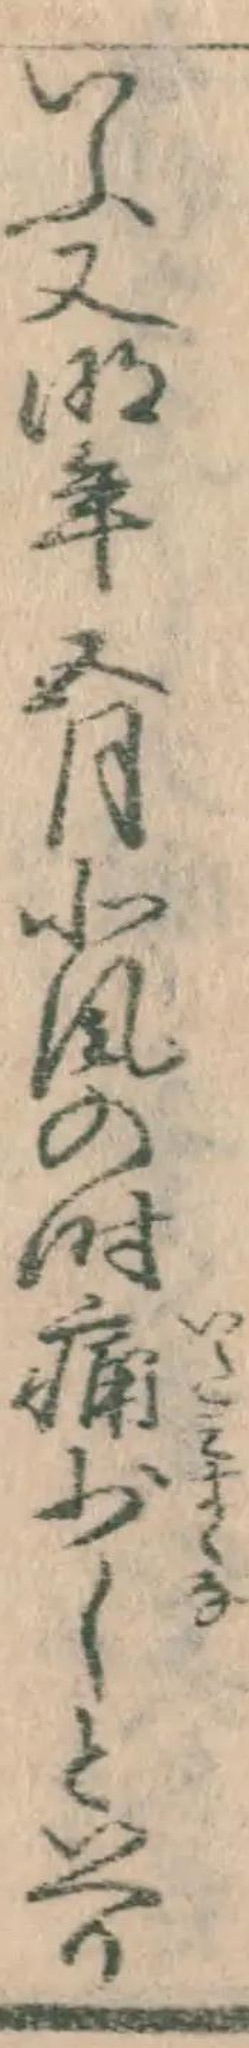いふ又明年五月北風の時痛少しといへり
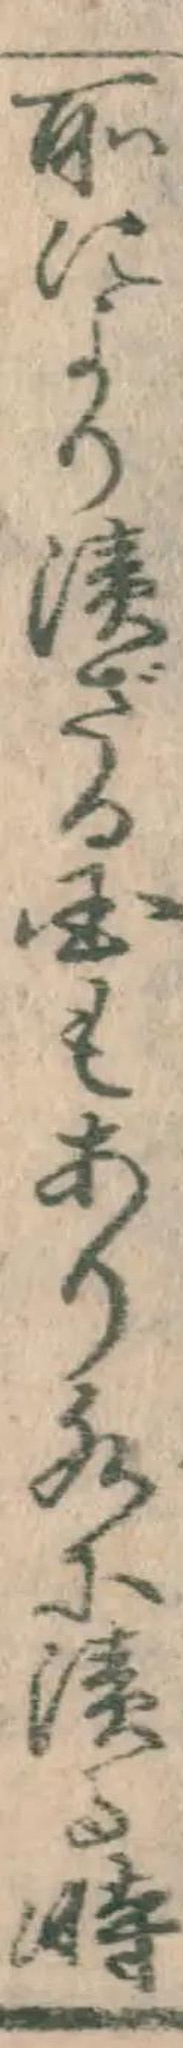所により漬ざる国もあり水に漬る時
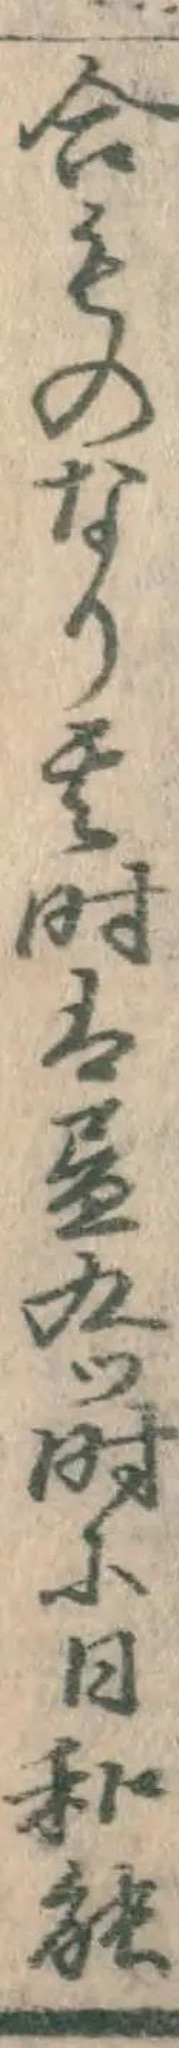合ものなり其時は昼九ッ時に日和能
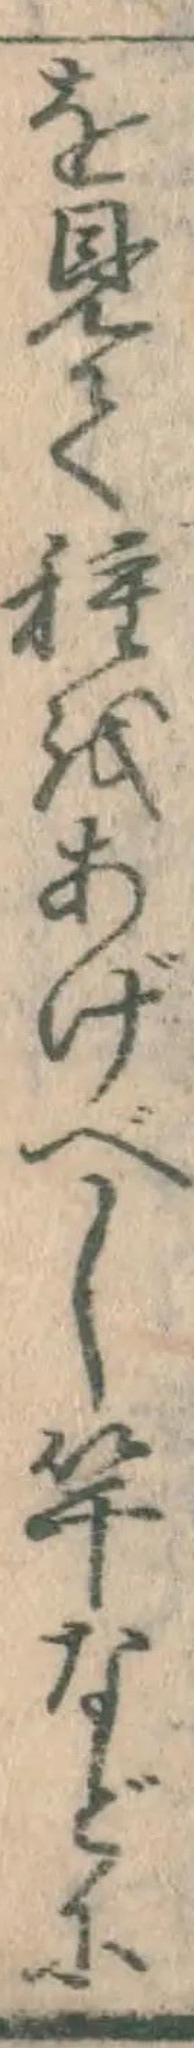を見て種をあげべし竿などに
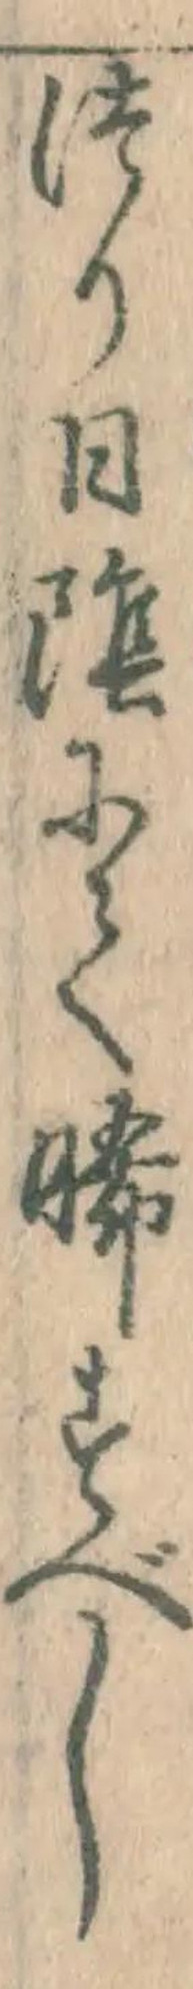つり日陰にて晞すべし

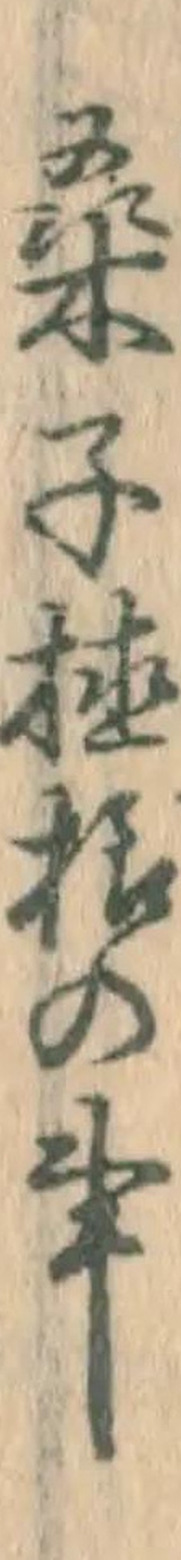桑子植様の事
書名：養蚕秘録 3巻. [1]
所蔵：国立国会図書館 National Diet Library, JAPAN
